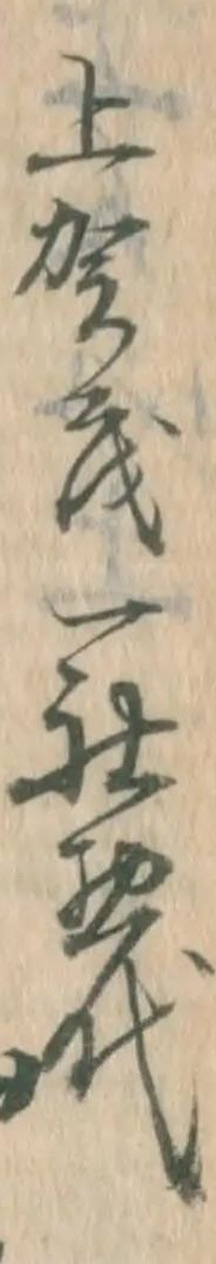上賀茂一社惣代
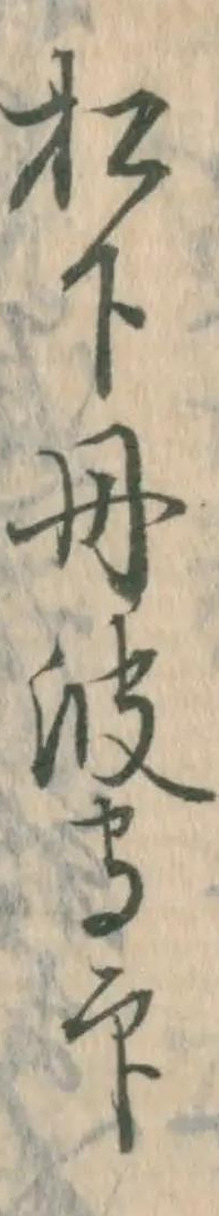松下丹波守印
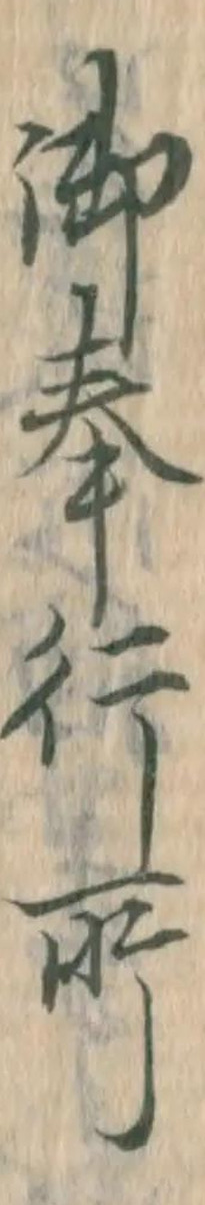御奉行所
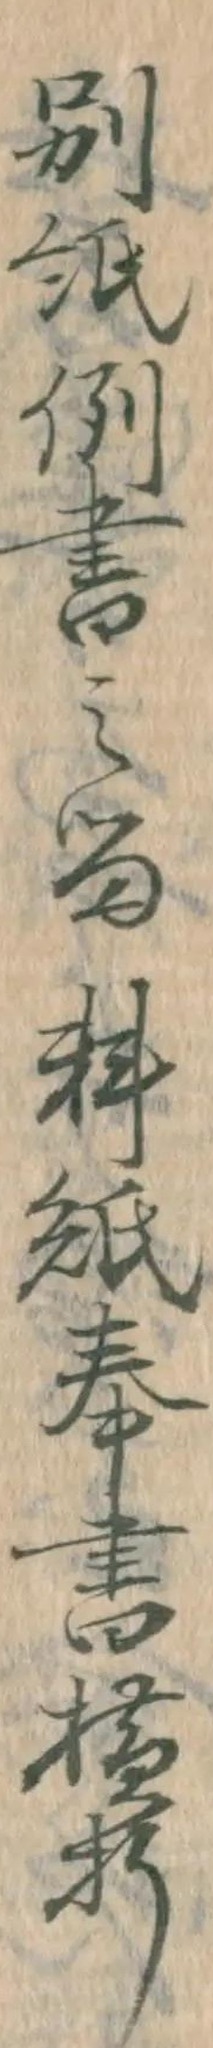別紙例書之留料紙奉書横折
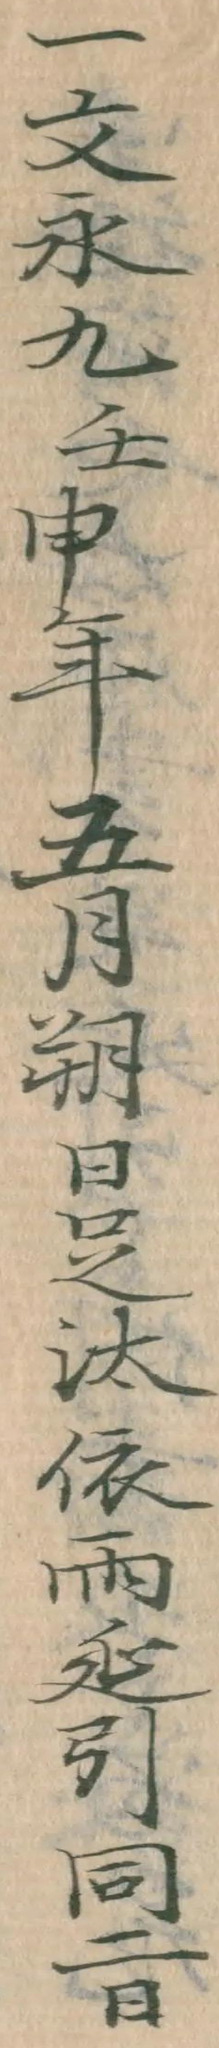一文永九壬申年五月朔日足汰依雨延引同二日
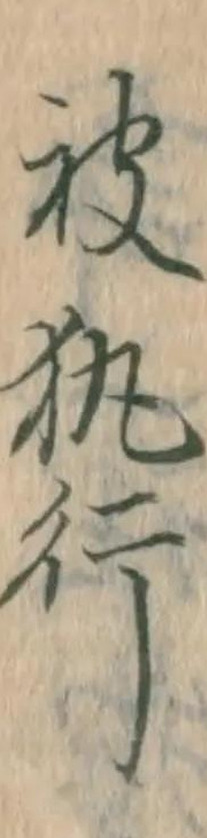被執行
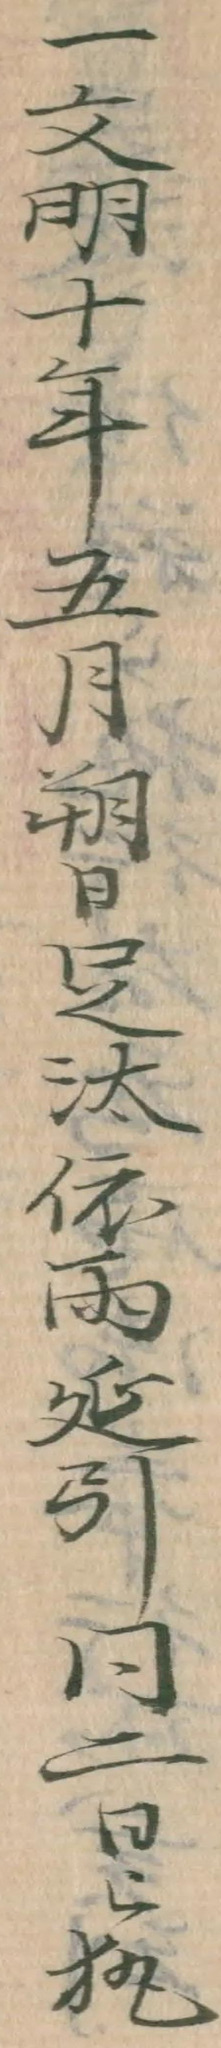一文明十年五月朔日足汰依雨延引同二日被執
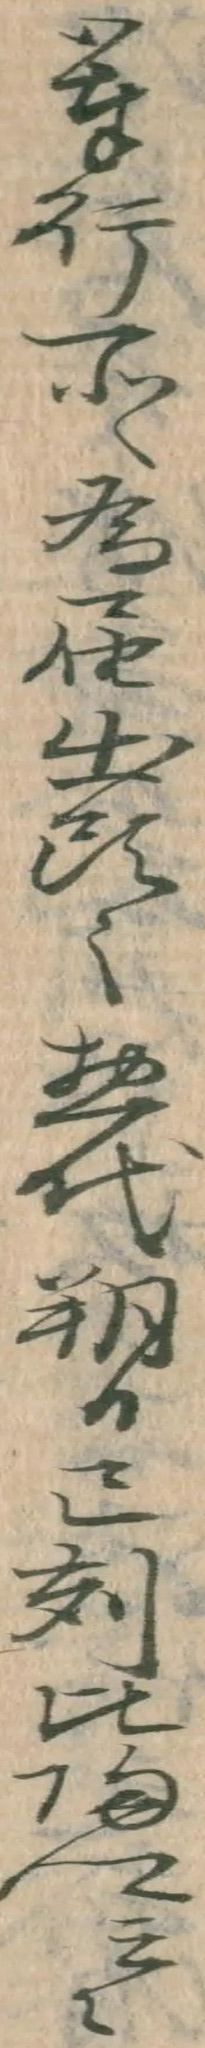御奉行所へ為届出頭之惣代朔日巳刻比帰郷云々
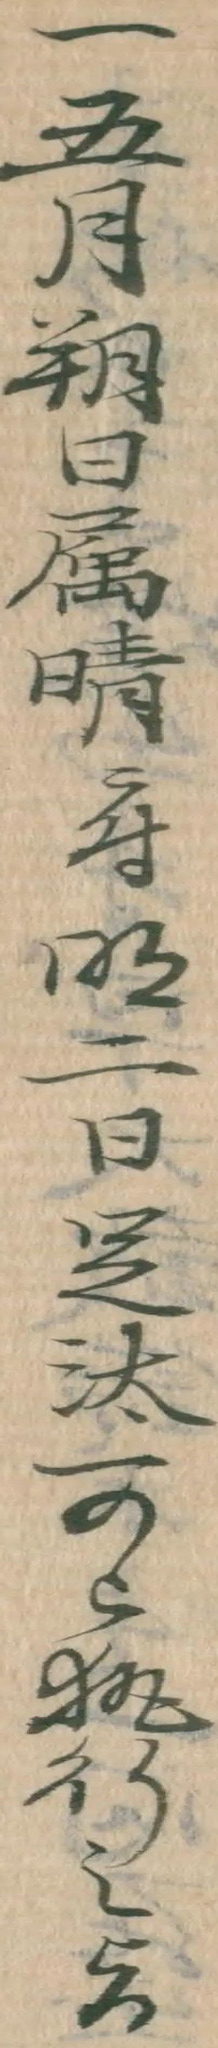一五月朔日属晴ニ付明二日足汰可被執行之旨
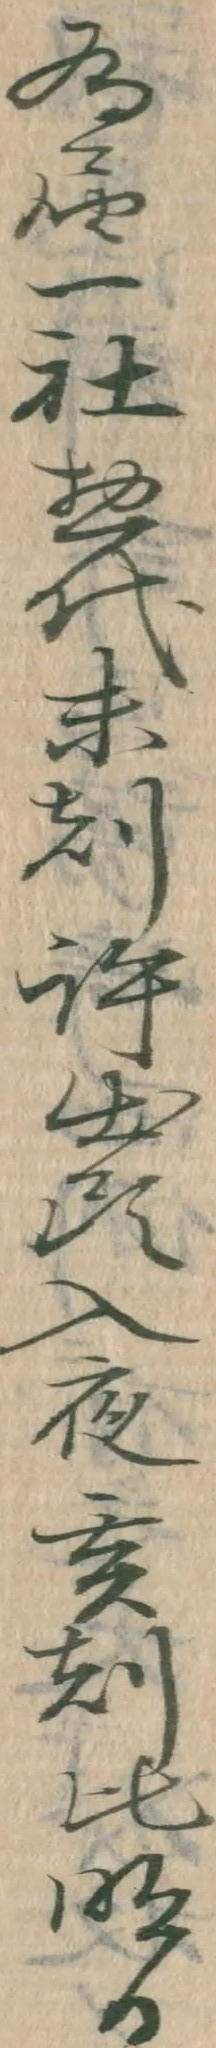為届一社惣代未刻許出頭入夜亥刻比明日
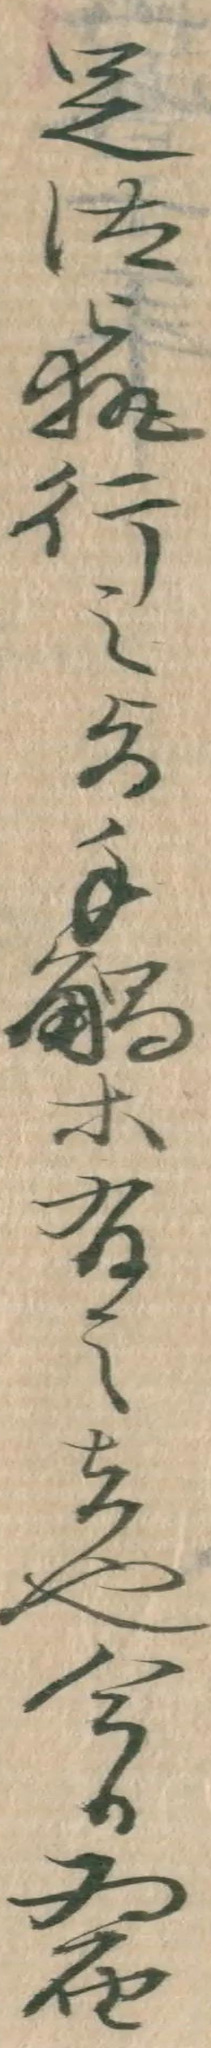足汰被執行之旨手触等有之者也今日為届
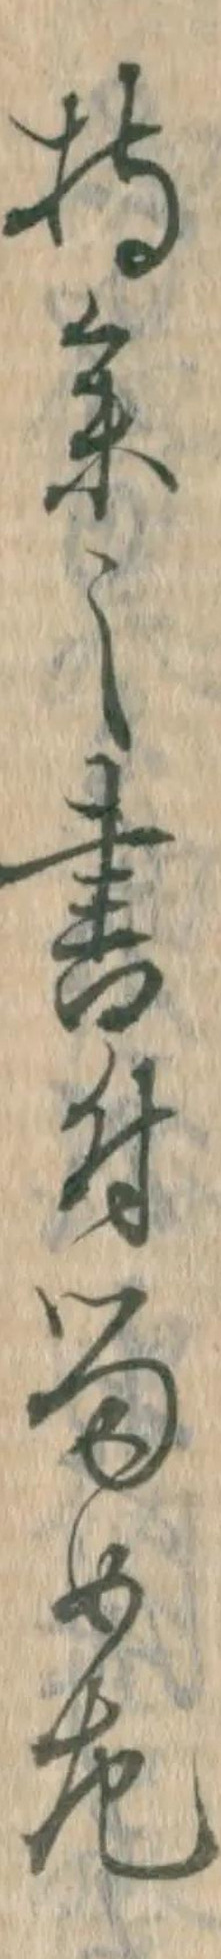持参之書付留如左
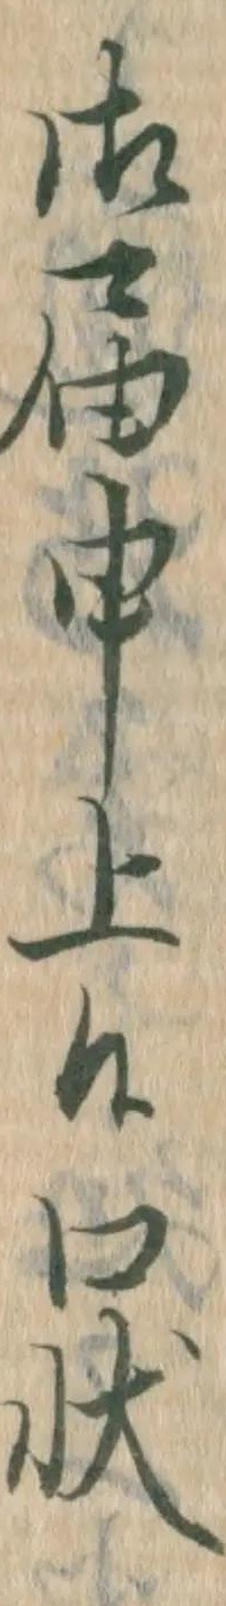御届申上候口状
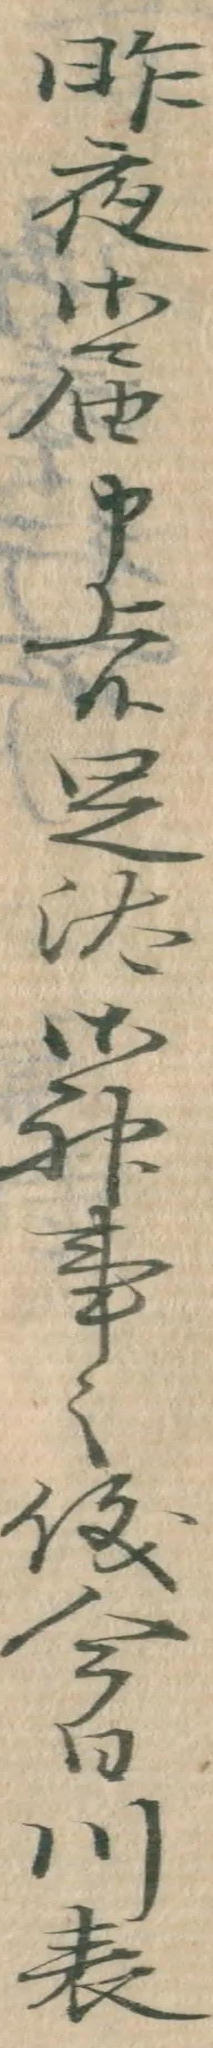昨夜御届申上候足汰御神事之儀今日川表
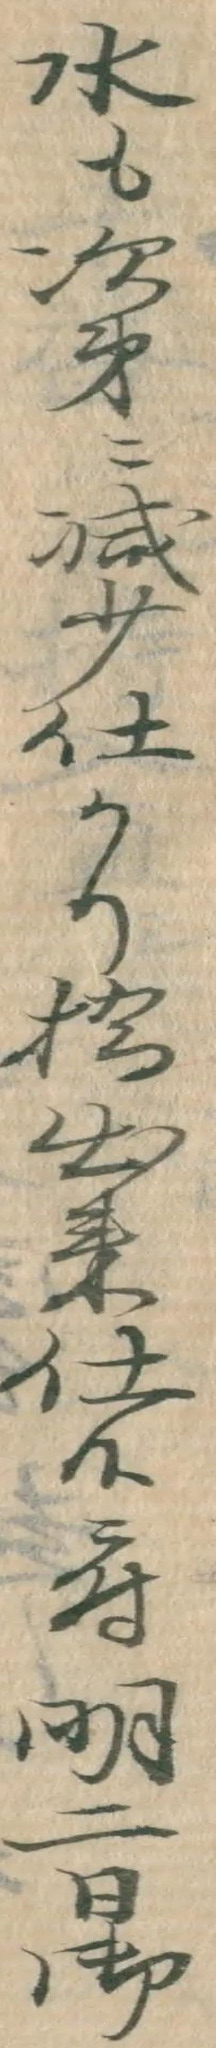水も次第ニ減少仕かり橋出来仕候ニ付明二日御
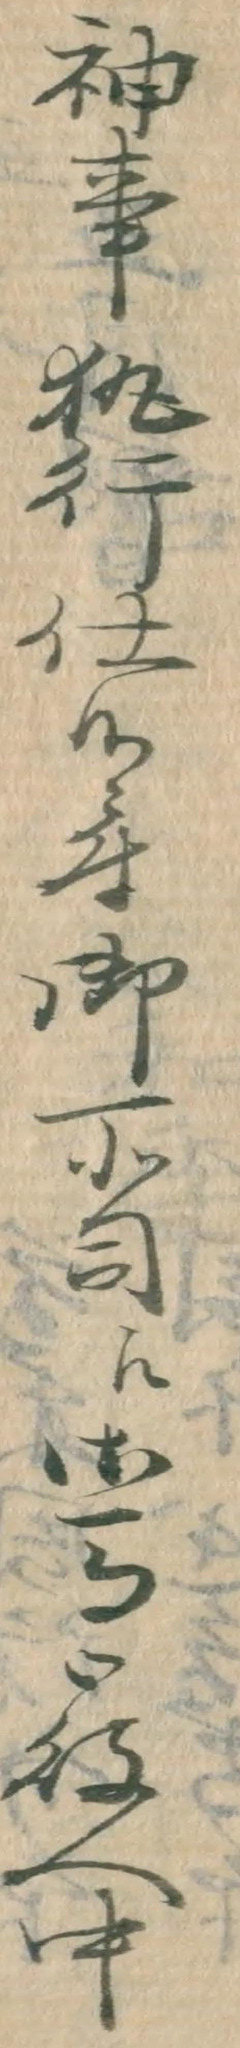神事執行仕候ニ付御所司江御馬御役人中
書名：賀茂社記録. 第10冊
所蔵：国立国会図書館 National Diet Library, JAPAN
